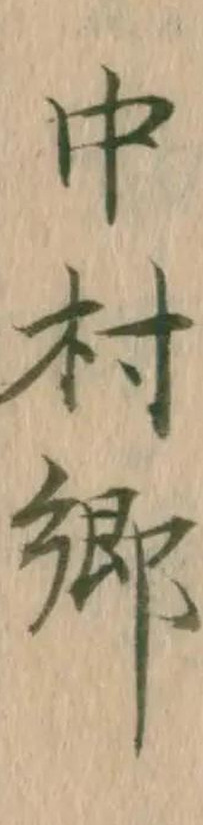中村郷
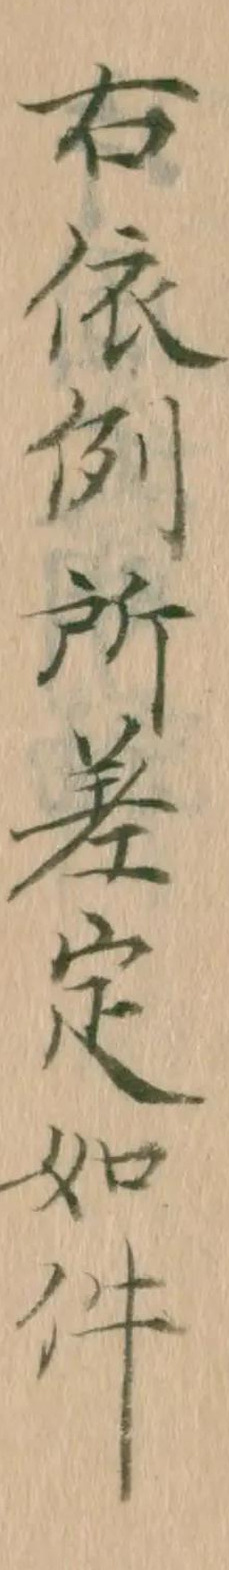右依例所差定如件
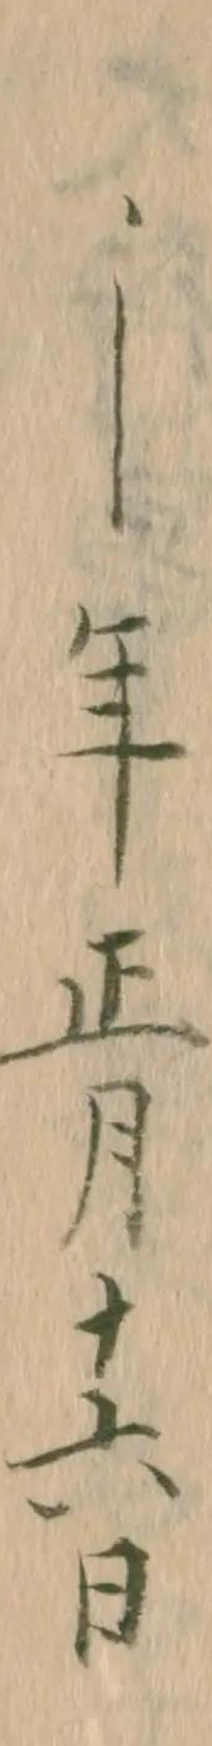――年正月十六日
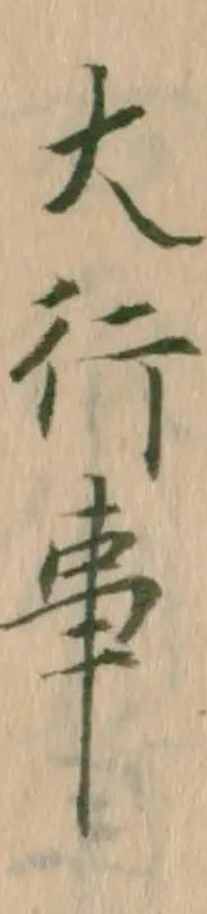大行事
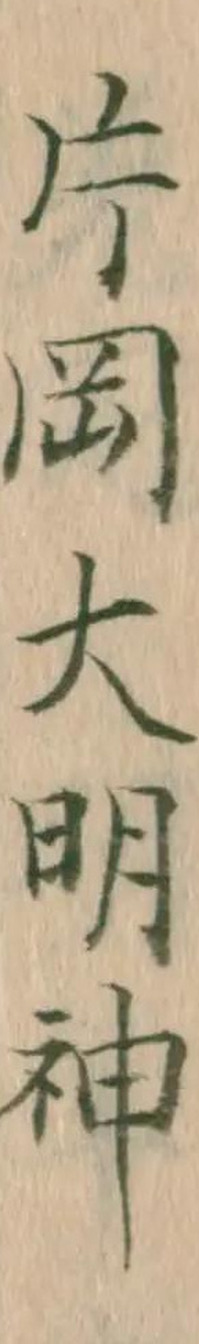片岡大明神
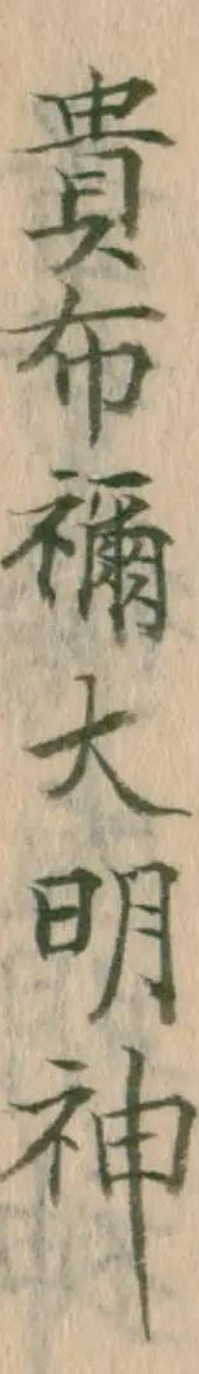貴布祢大明神
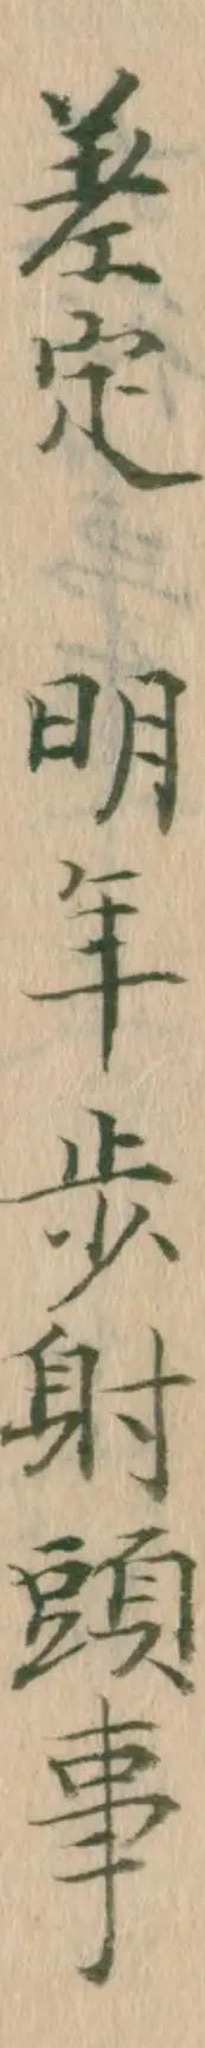差定明年歩射頭事
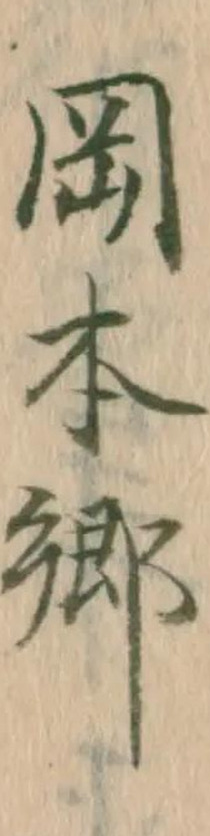岡本郷
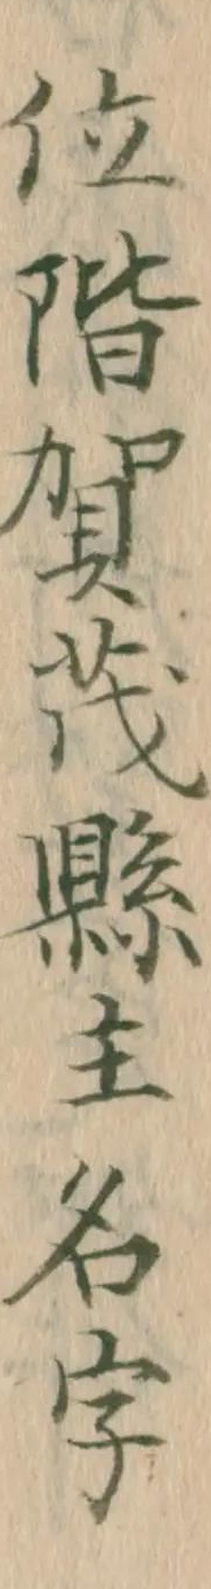位階賀茂県主名字
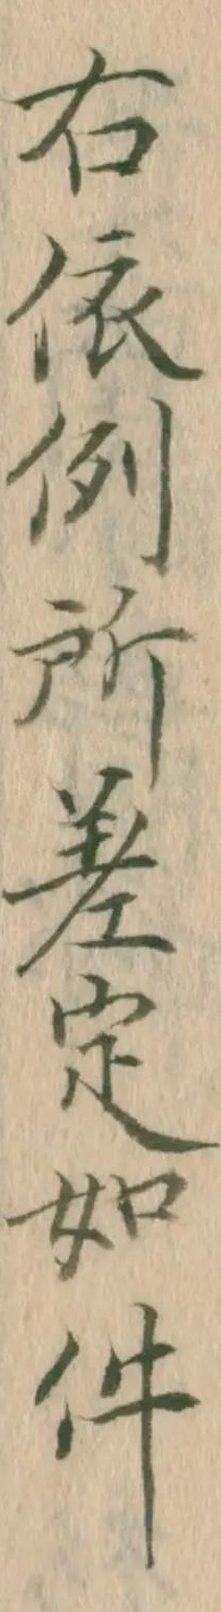右依例所差定如件
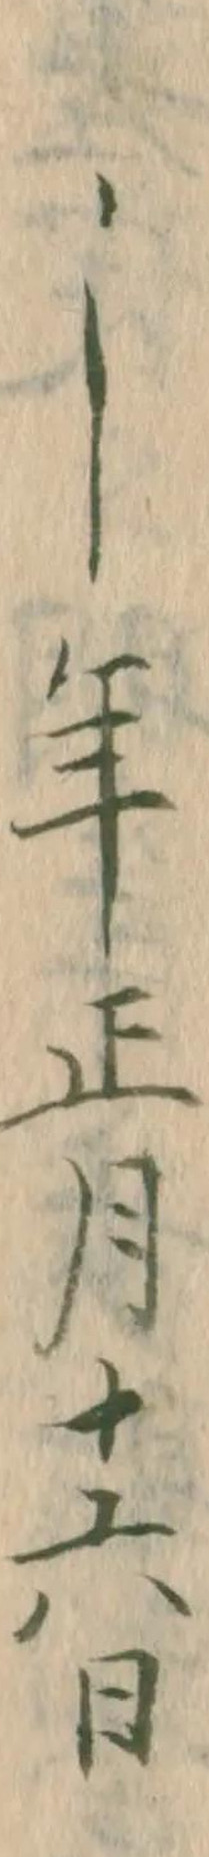――年正月十六日
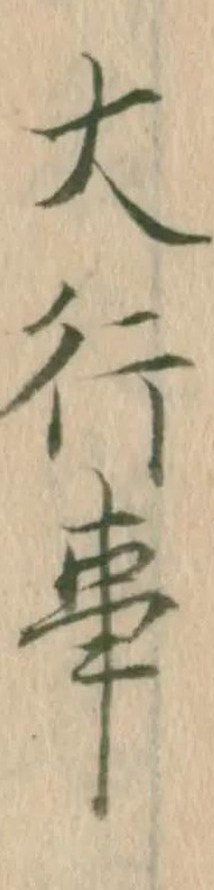大行事
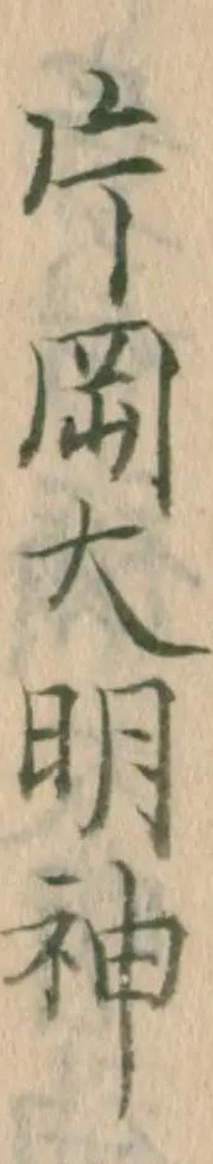片岡大明神

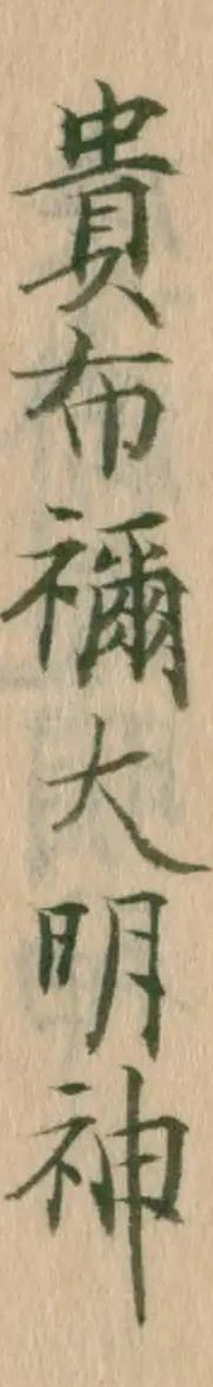貴布祢大明神
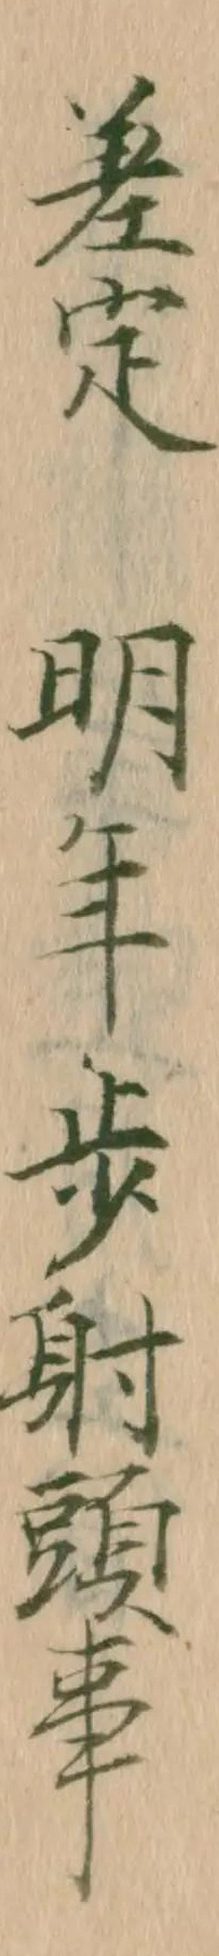差定明年歩射頭事
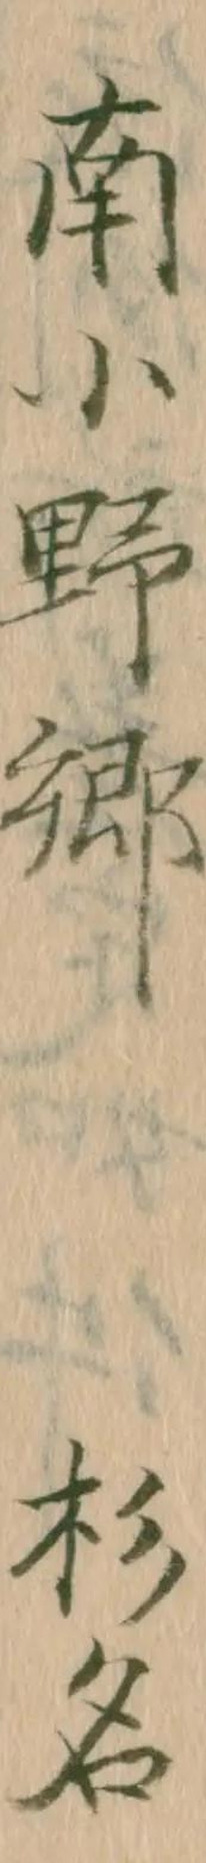南小野郷杉名
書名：賀茂社記録. 第26冊
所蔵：国立国会図書館 National Diet Library, JAPAN
